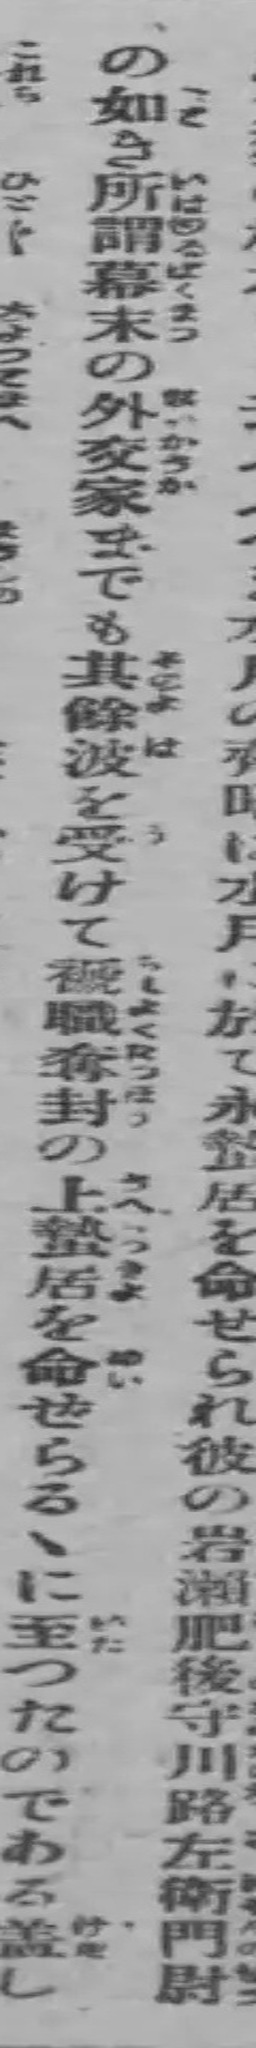の如き所謂幕末の外交家までも其余波を受けて褫職奪封の上蟄居を命ぜらるゝに至つたのである蓋し
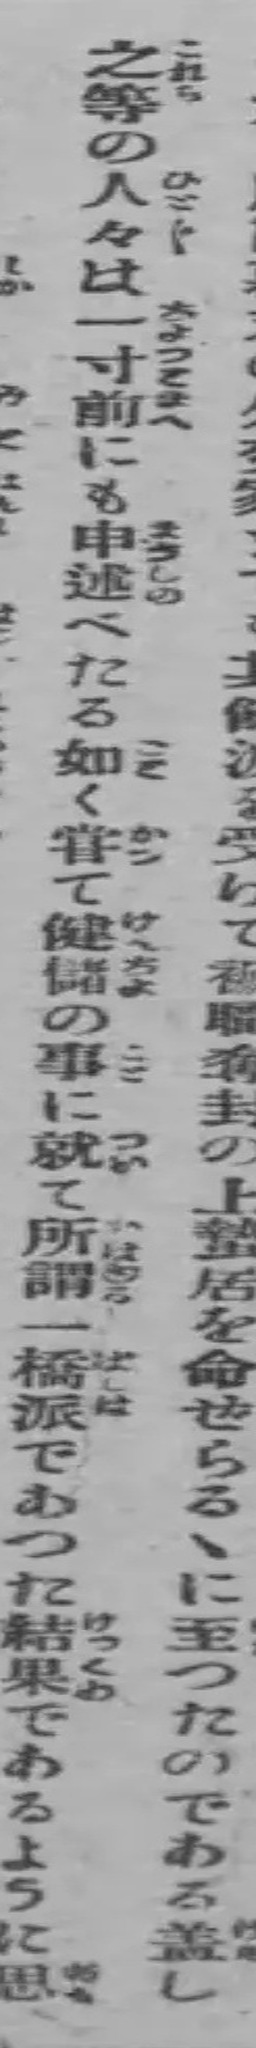之等の人々は一寸前にも申述べたる如く嘗て健儲の事に就て所謂一橋派であつた結果であるように思
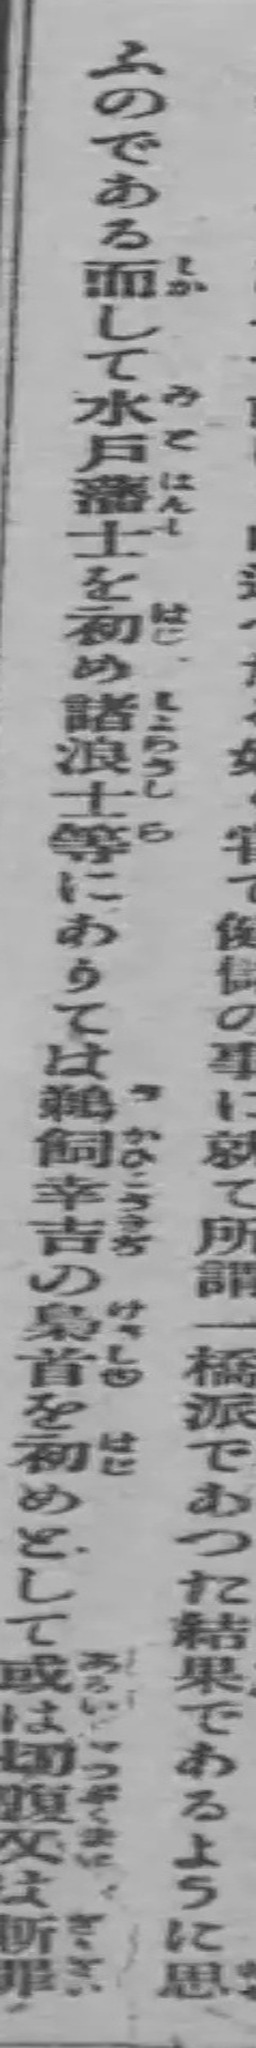ふのである而して水戸藩士を初め諸浪士等にありては鵜飼幸吉の梟首を初めとして或は切腹又は斬罪
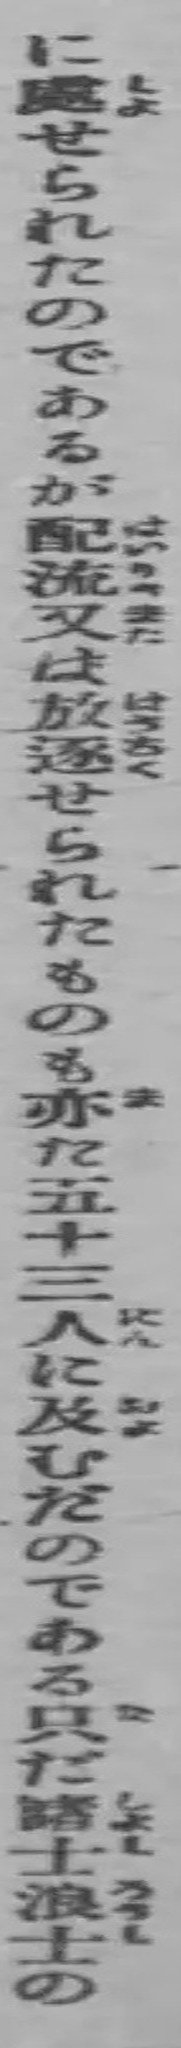に処せられたのであるが配流又は放逐せられたものも亦た五十三人に及むだのである只だ諸士浪士の
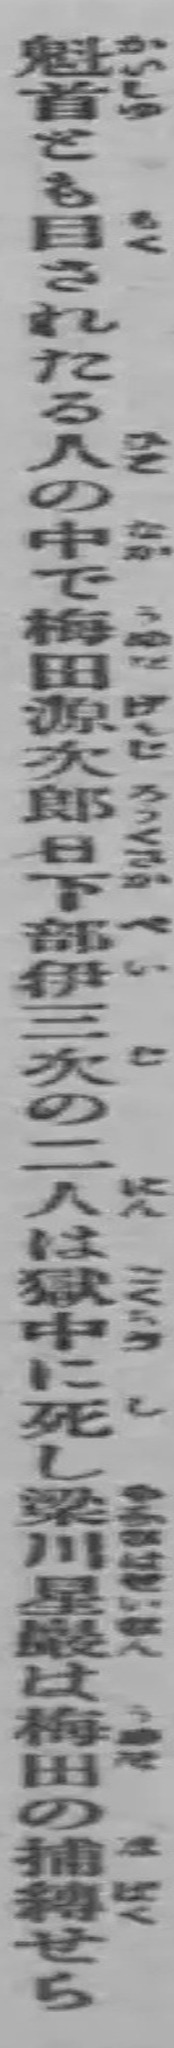魁首とも目されたる人の中で梅田源次郎日下部伊三次の二人は獄中に死し梁川星嚴は梅田の捕縛せら
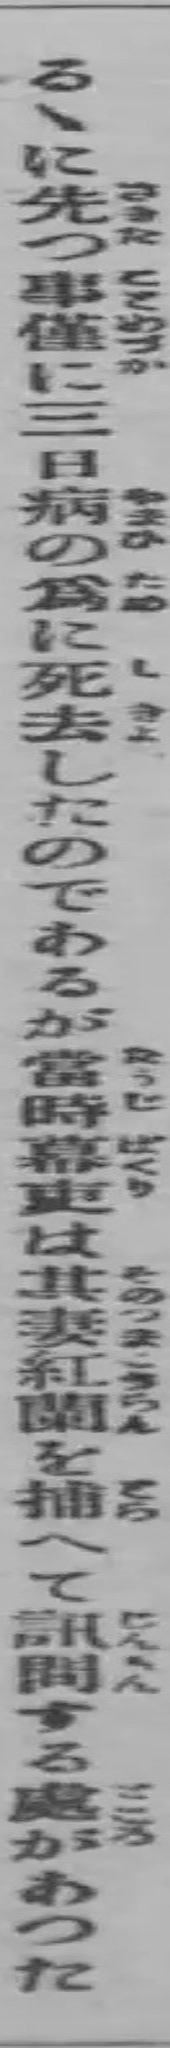るゝに先つ事僅に三日病の為に死去したのであるが当時幕吏は其妻紅蘭を捕へて訊問する処があつた
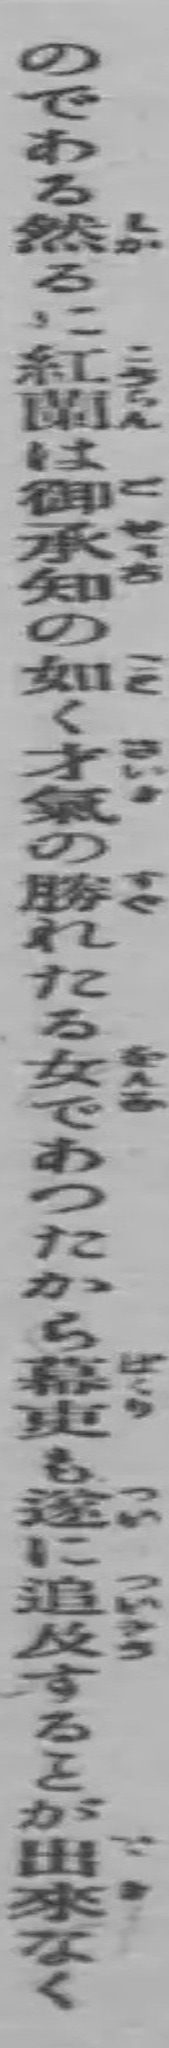のである然るに紅蘭は御承知の如く才気の勝れたる女であつたから幕吏も遂に追及することが出来なく
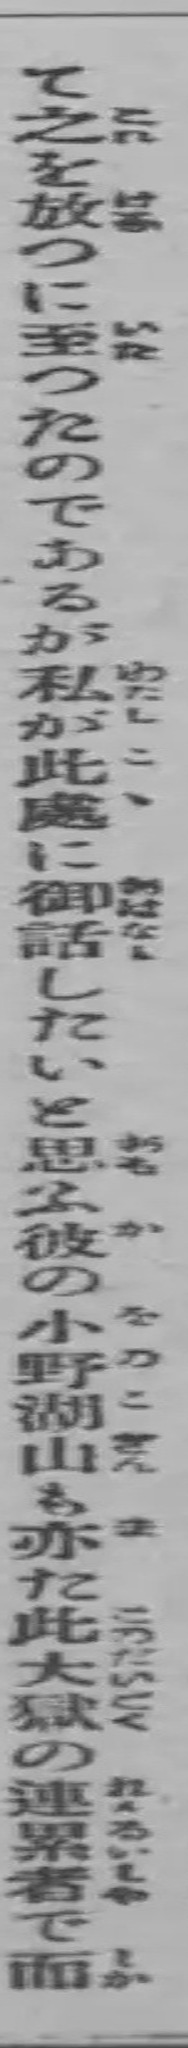小野湖山て之を放つに至つたのであるが私が此処に御話したいと思ふ彼の小野湖山も亦た此大獄の連累者で而
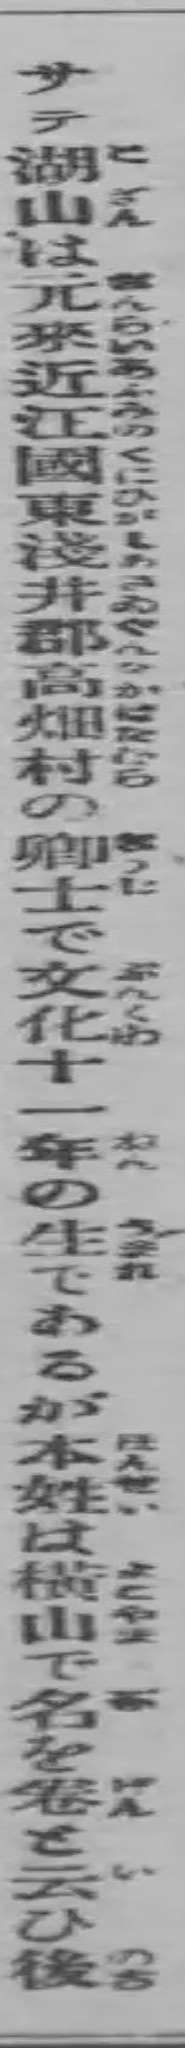サテ湖山は元来近江国東浅井郡高畑村の郷士で文化十一年の生であるが本姓は横山で名を巻と云ひ後
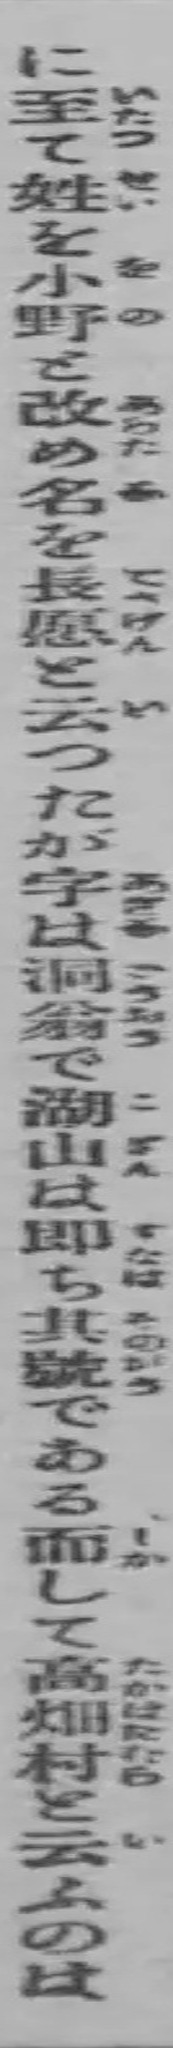に至て姓を小野と改め名を長愿と云つたが字は洞翁で湖山は即ち其号である而して高畑村と云ふのは
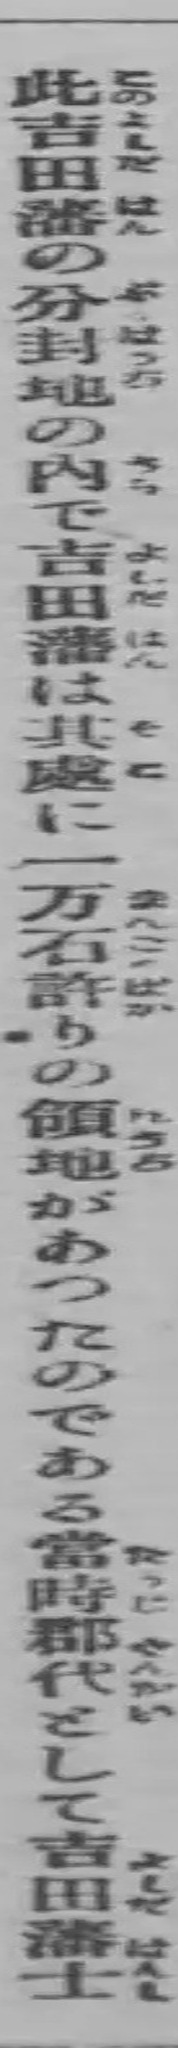此吉田藩の分封地の内で吉田藩は其処に一万石許りの領地があつたのである当時郡代として吉田藩士
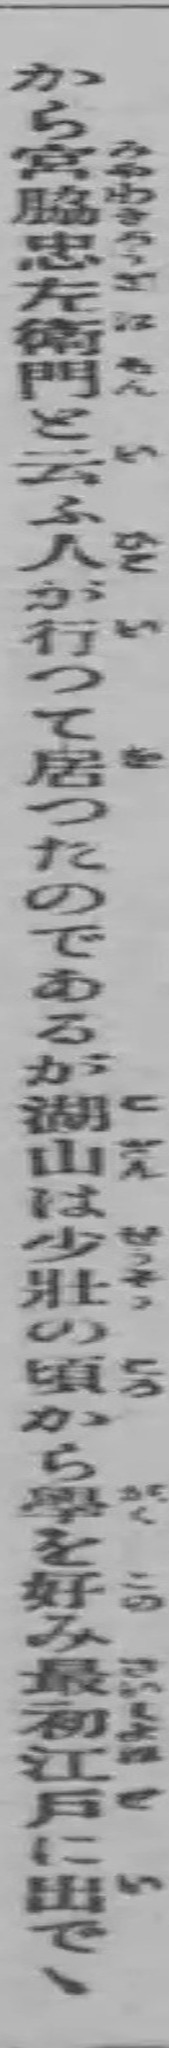から宮脇忠左衛門と云ふ人が行つて居つたのであるが湖山は少壮の頃から学を好み最初江戸に出でゝ
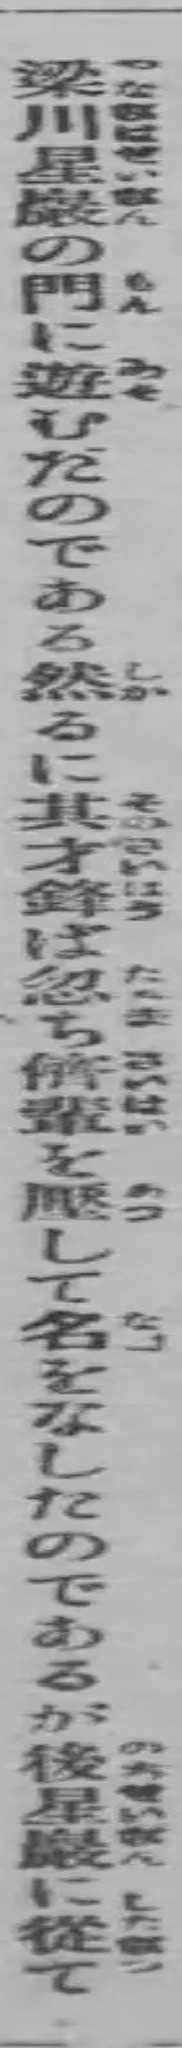梁川星嚴の門に遊むだのである然るに其才鋒は忽ち儕輩を圧して名をなしたのであるが後星嚴に従て
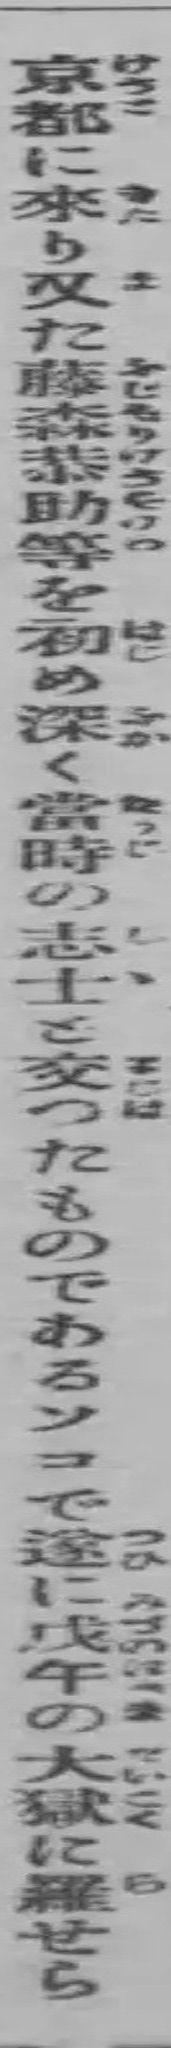京都に来り又た藤森恭助等を初め深く当時の志士と交つたものであるソコで遂に戊午の大獄に羅せら
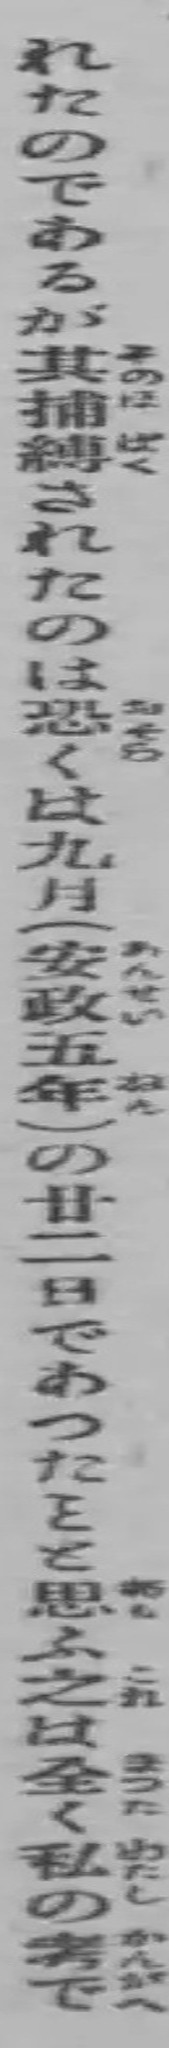れたのであるが其捕縛されたのは恐くは九月(安政五年)の廿二日であつたことと思ふ之は全く私の考で
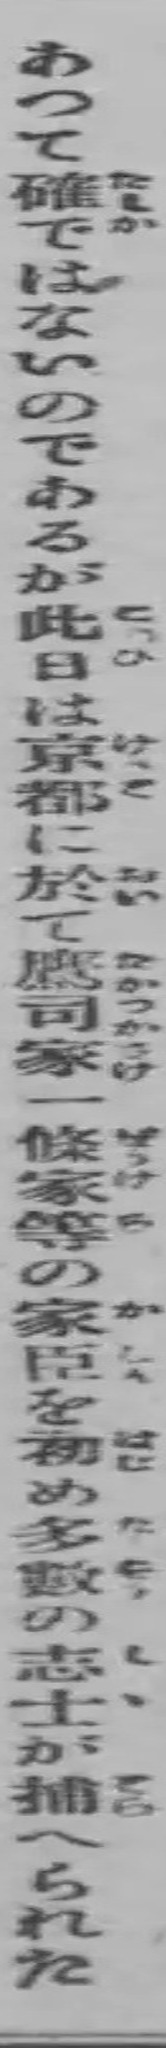あつて確ではないのであるが此日は京都に於て鷹司家一条家等の家臣を初め多数の志士が捕へられた
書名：豊橋市史談
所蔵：国立国会図書館 National Diet Library, JAPAN
